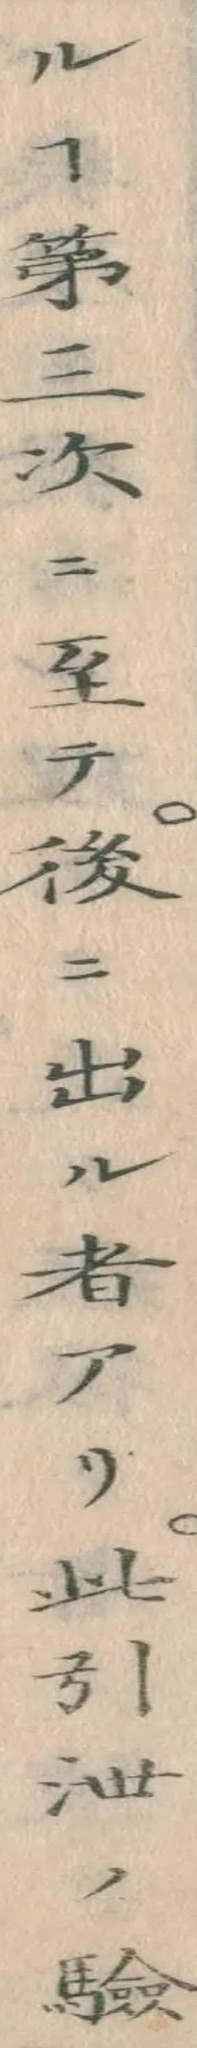ルヿ第三次ニ至テ。後ニ出ル者アリ。此引泄ノ験
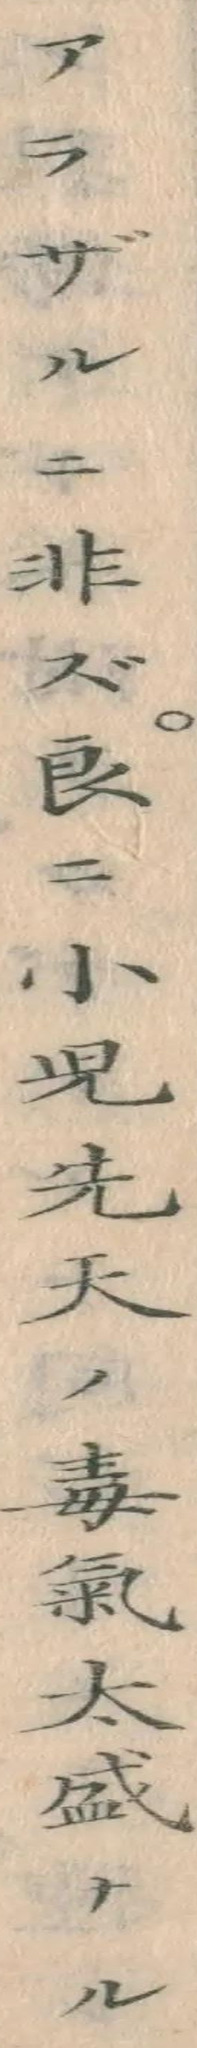アラザルニ非ズ。良ニ小児先天ノ毒気太盛ナル
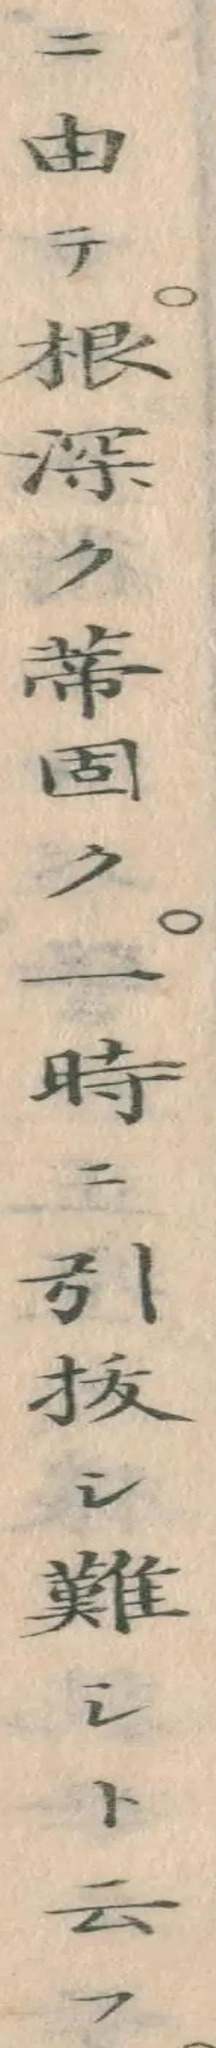ニ由テ。根深ク蒂固ク。一時ニ引抜シ難シト云フ。
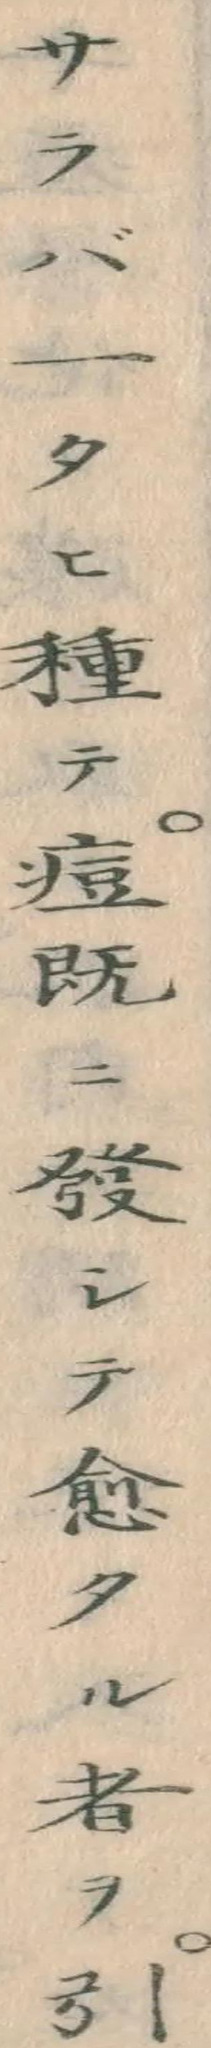サラバ一タヒ種テ。痘既ニ発シテ愈タル者ヲ。引
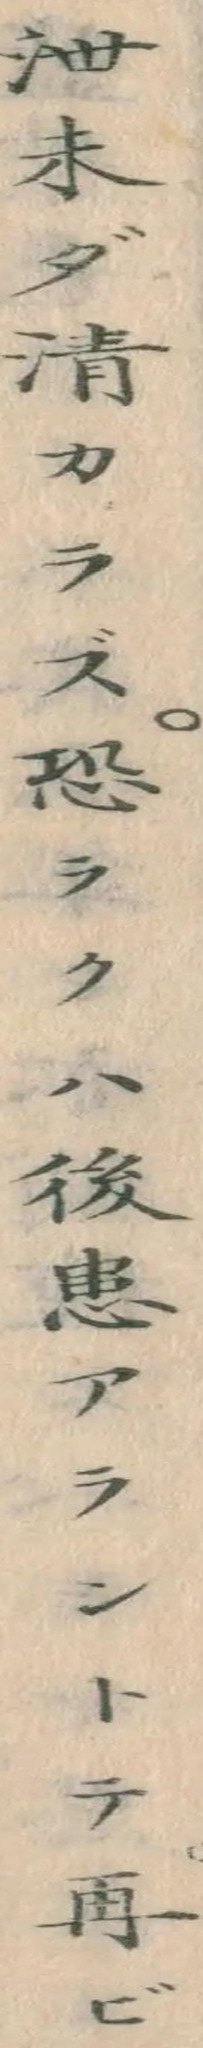泄未ダ清カラズ。恐ラクハ後患アラントテ。再ビ
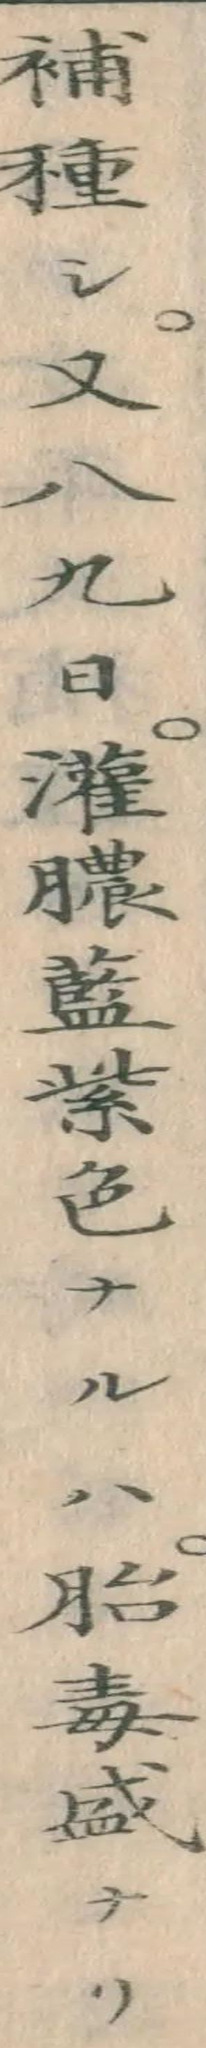補種シ。又八九日。灌膿藍紫色ナルハ。胎毒盛ナリ

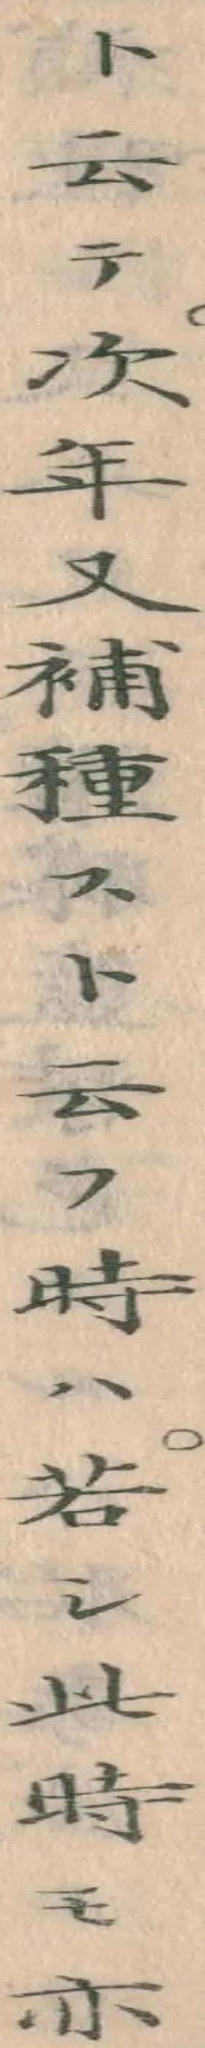ト云テ。次年又補種スト云フ時ハ。若シ此時モ亦
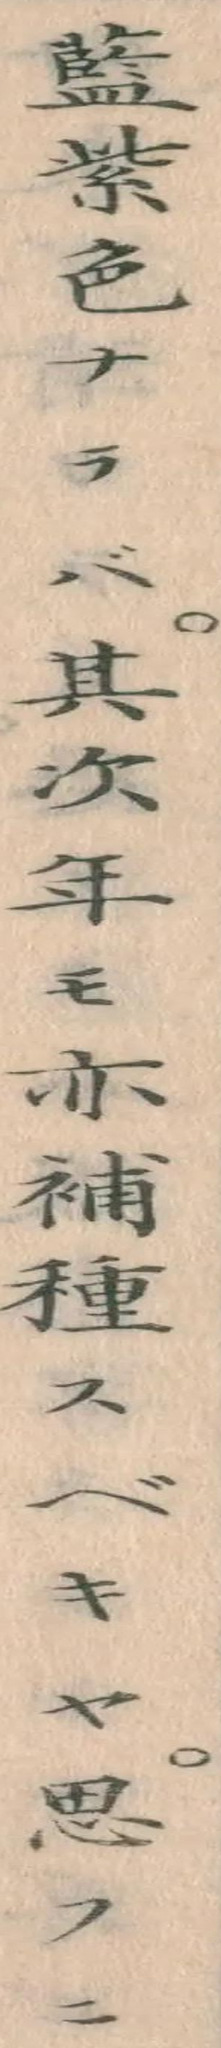藍紫色ナラバ。其次年モ亦補種スベキヤ。思フニ
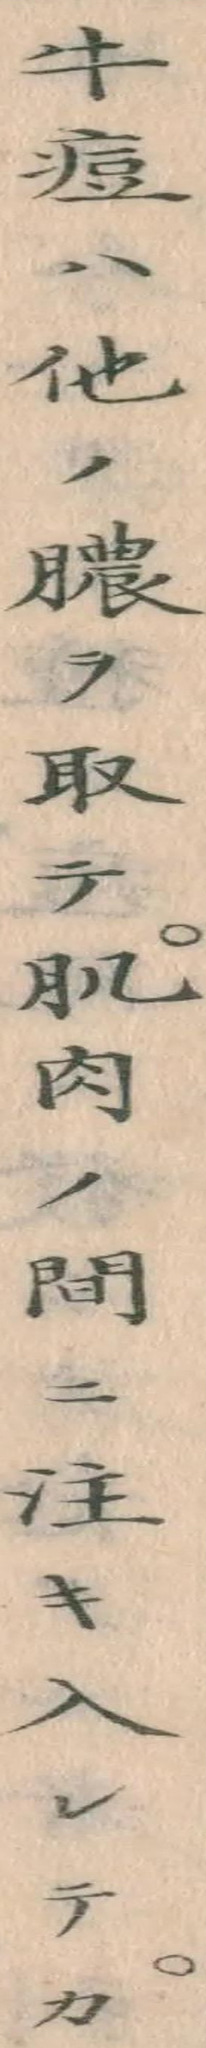牛痘ハ他ノ膿ヲ取テ。肌肉ノ間ニ注キ入レテ。カ
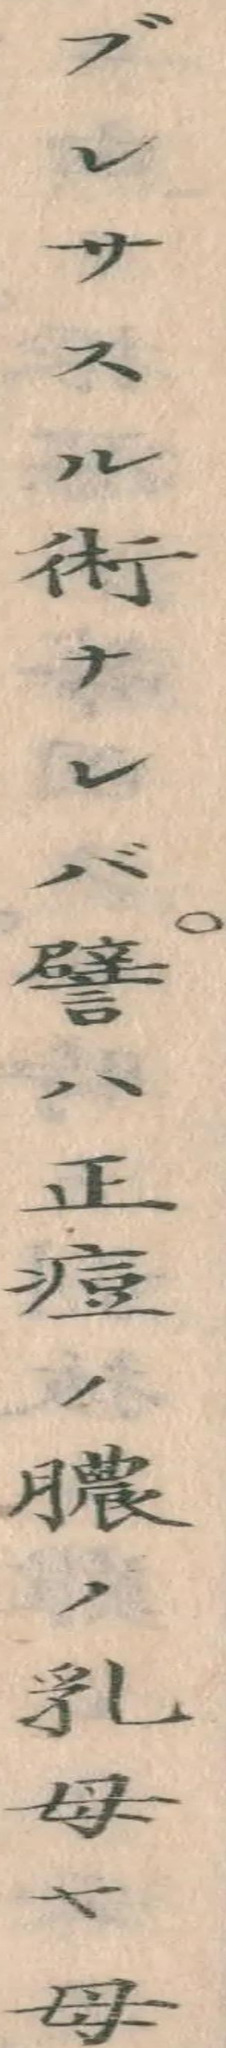ブレサスル術ナレバ。譬ハ正痘ノ膿ノ乳母ヤ母
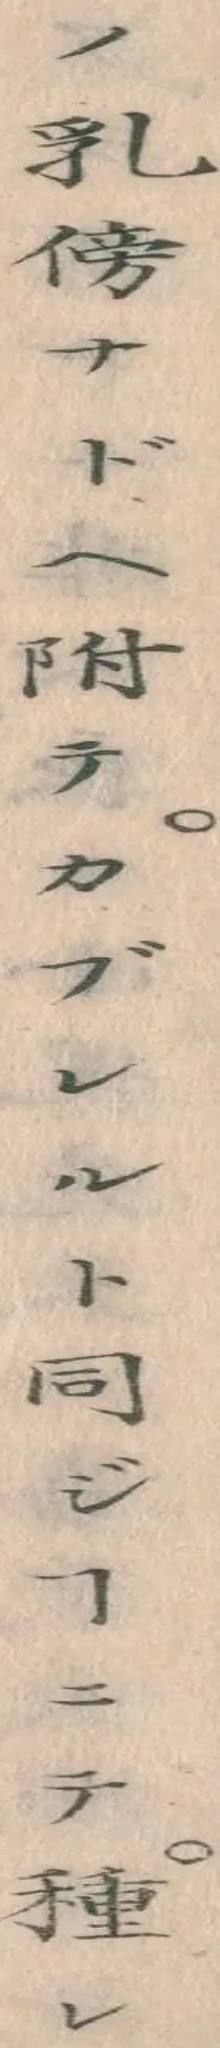ノ乳傍ナドヘ附テ。カブレルト同ジヿニテ。種レ
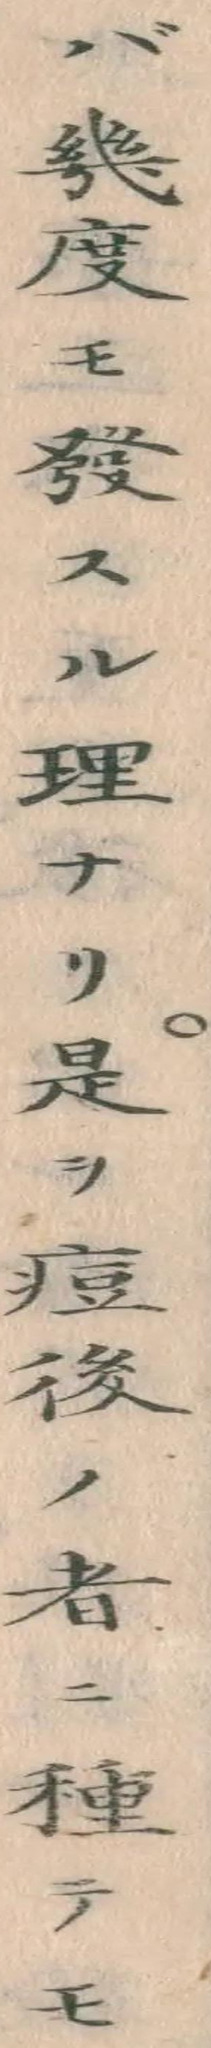バ幾度モ発スル理ナリ。是ヲ痘後ノ者ニ種テモ
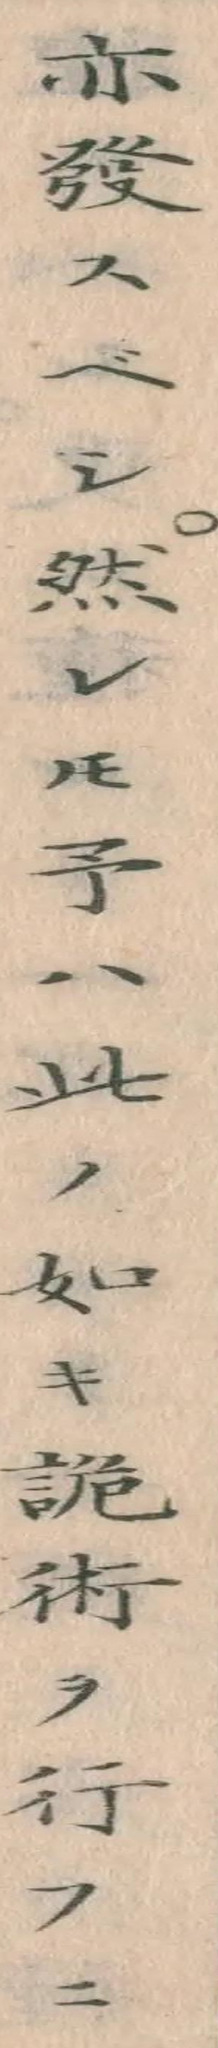亦発スベシ。然レ𪜈予ハ此ノ如キ詭術ヲ行フニ
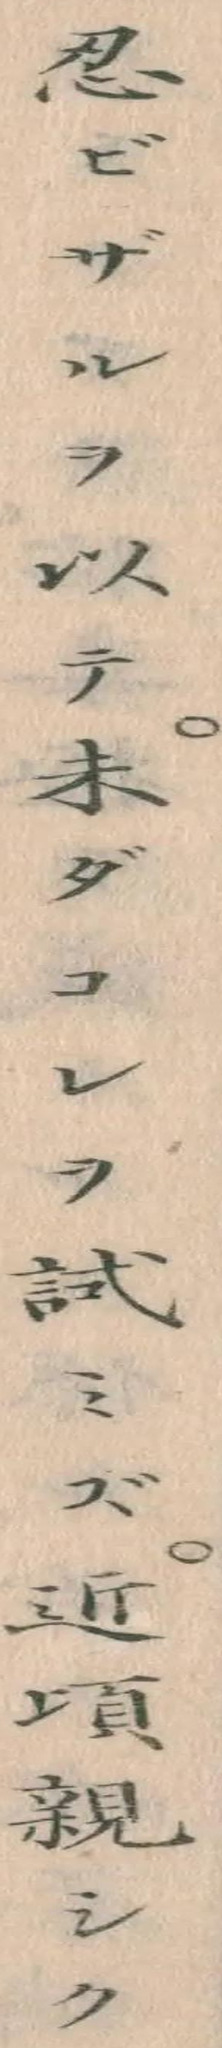忍ビザルヲ以テ。未ダコレヲ試ミズ。近頃親シク
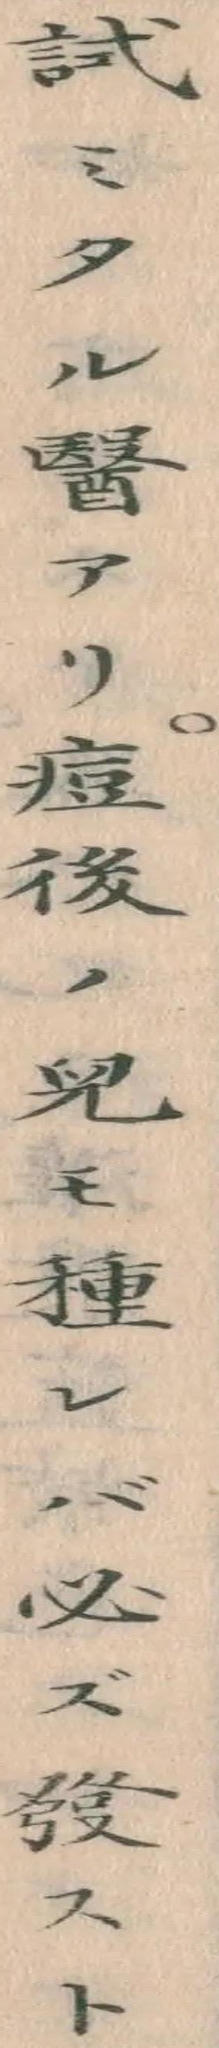試ミタル医アリ。痘後ノ児モ種レバ必ズ発スト
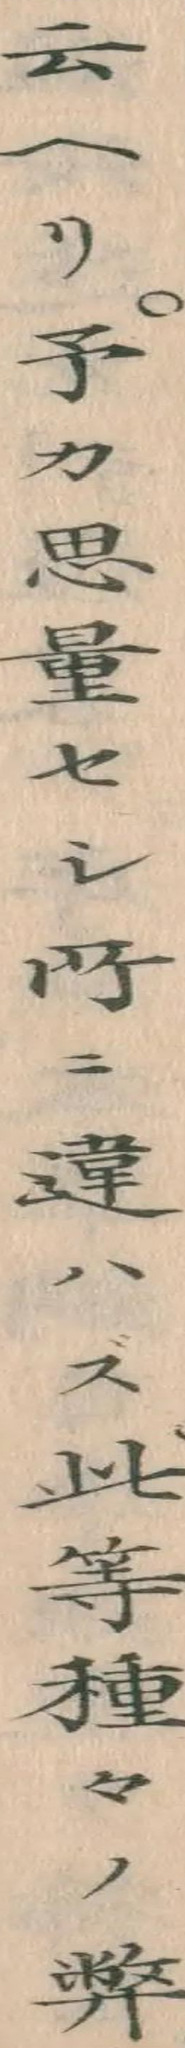云ヘリ。予カ思量セシ所ニ違ハス。此等種々ノ弊。
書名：種痘弁義
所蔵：国立国会図書館 National Diet Library, JAPAN
